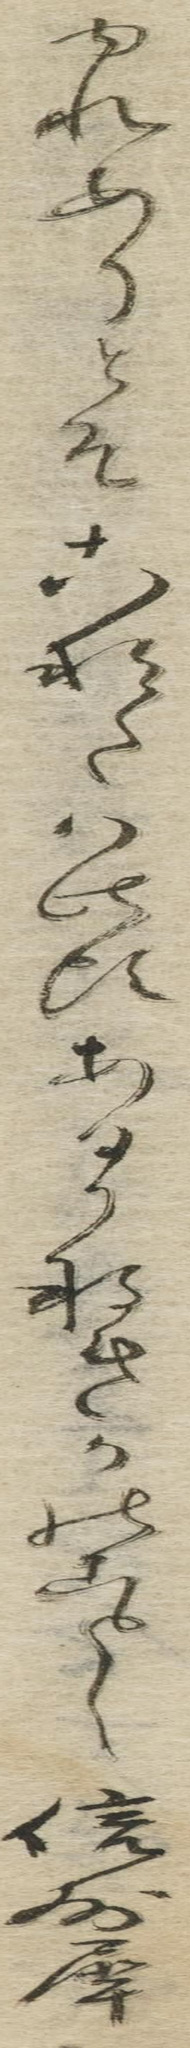ゆれありとそこなたハ此頃あまりなきかのことし信州犀
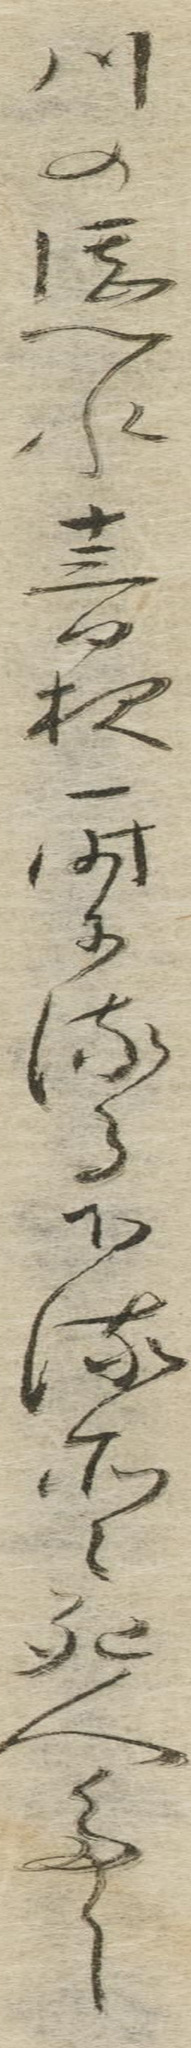川の湛へ水十三日夜一時に流る下流所々死人多し
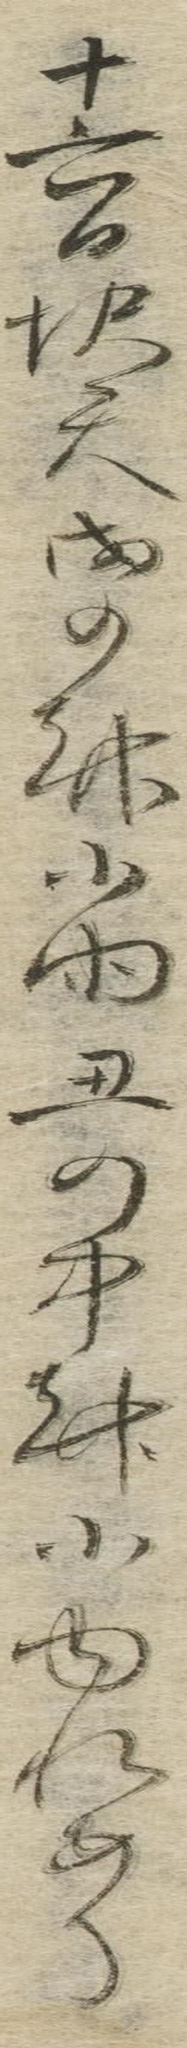十六日快天戌の刻小雨丑の中刻小ゆれあり

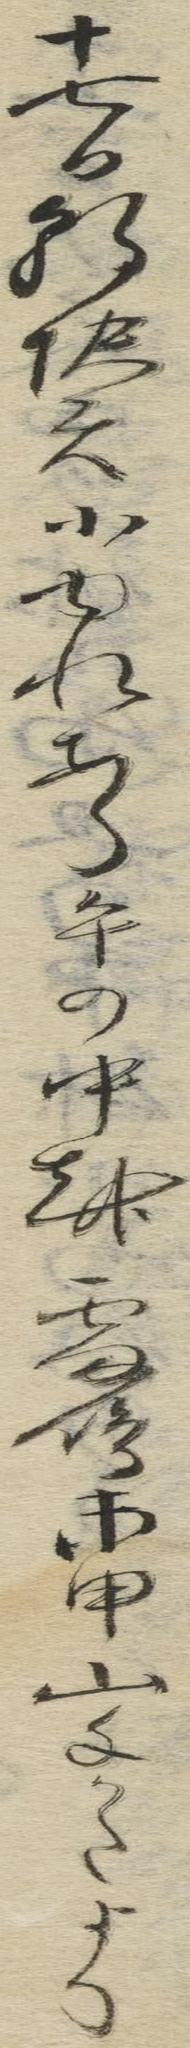十七日朝快天小ゆれあり午の中刻雷鳴御甲山手かたより
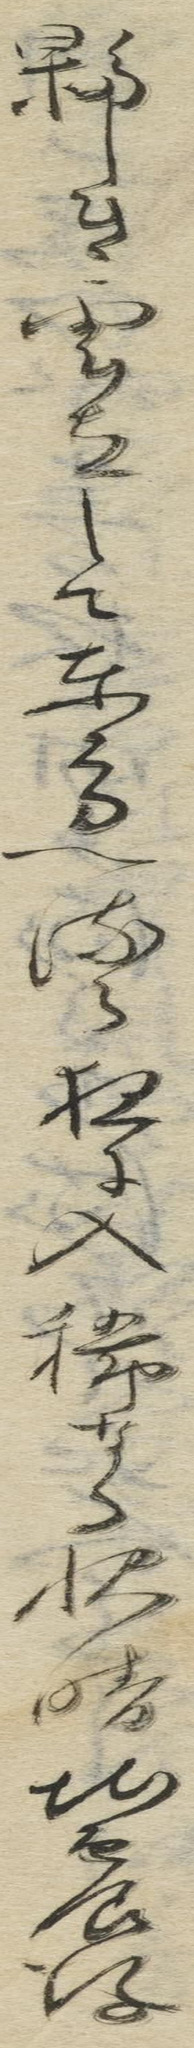夥しき雲立して東方へ流る夜に入稀なる快晴地震後
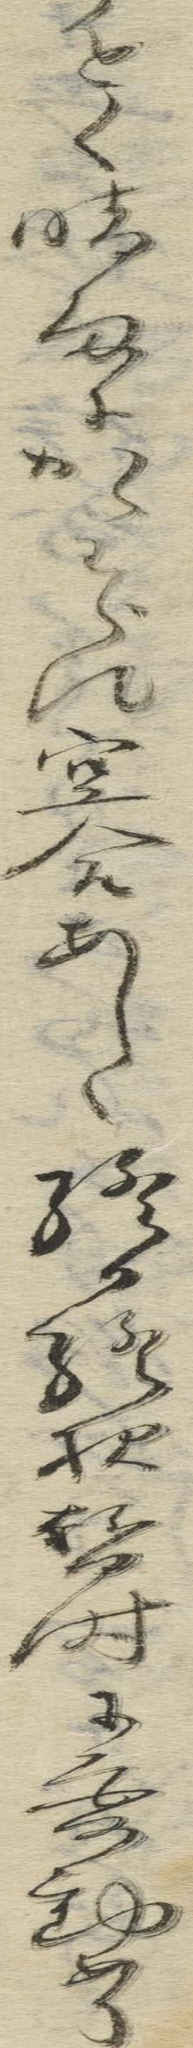近く晴たにかゝわらす空あしく終日終夜暫時に変動あり
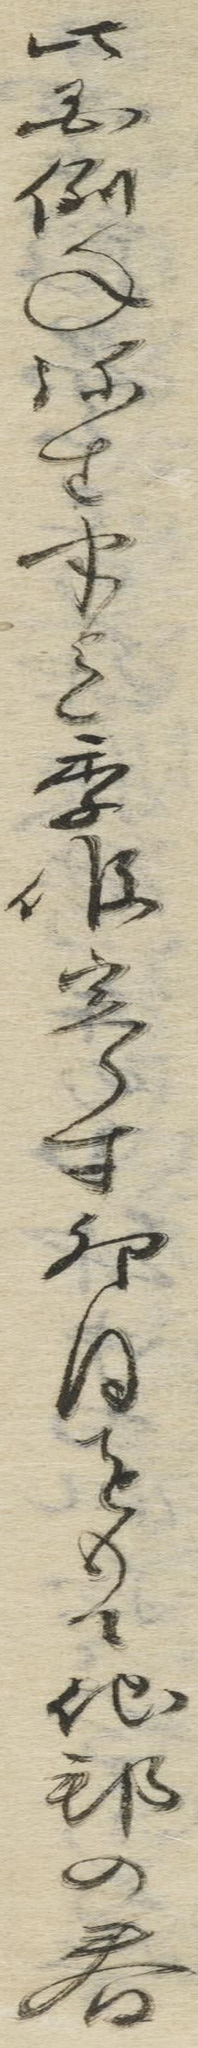此国例年弥生半迄季候定らす卯月をもて他邨の春
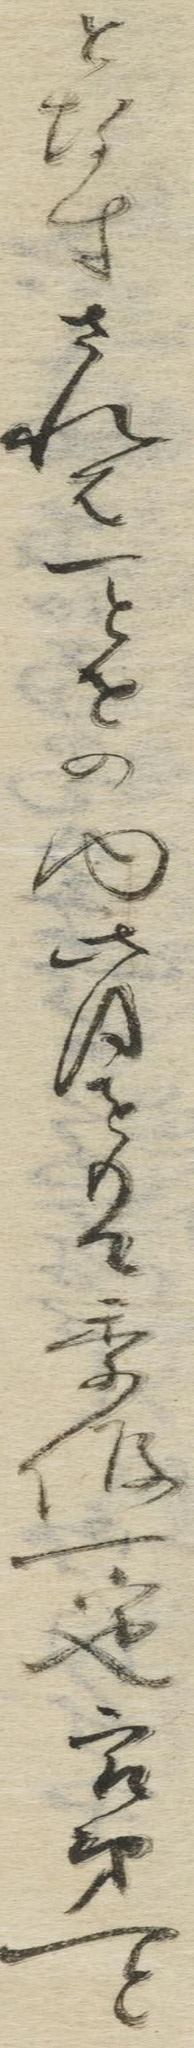となすされは一とせの内此月をもて季候一定也空第一と
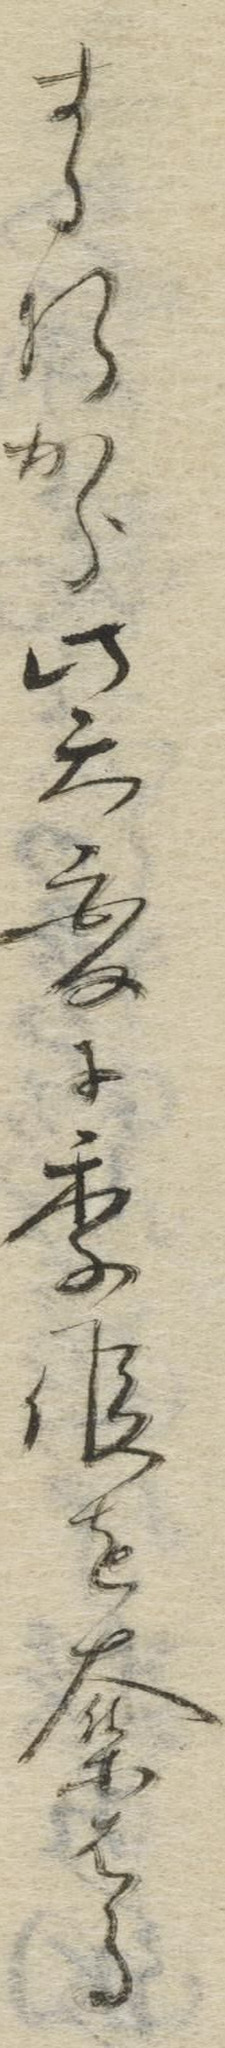するなから此大変に季候を奪はる
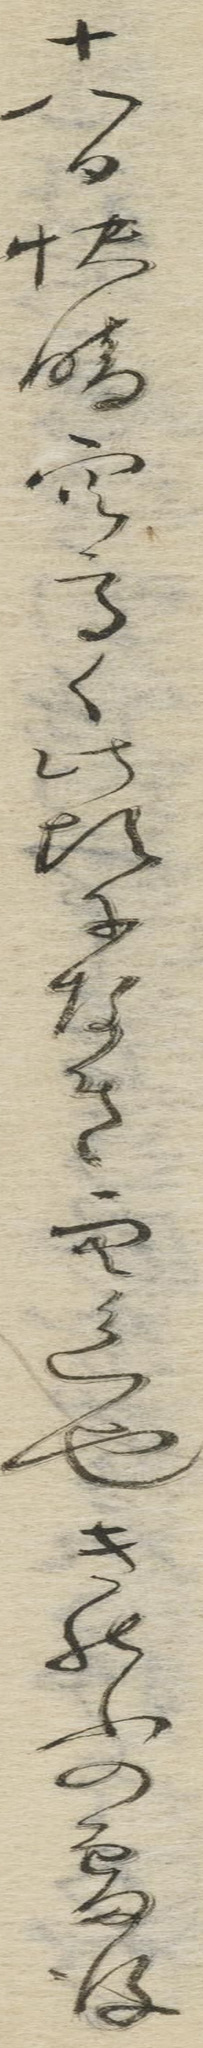十八日快晴空高く此頃になき空色也きのふの雷後
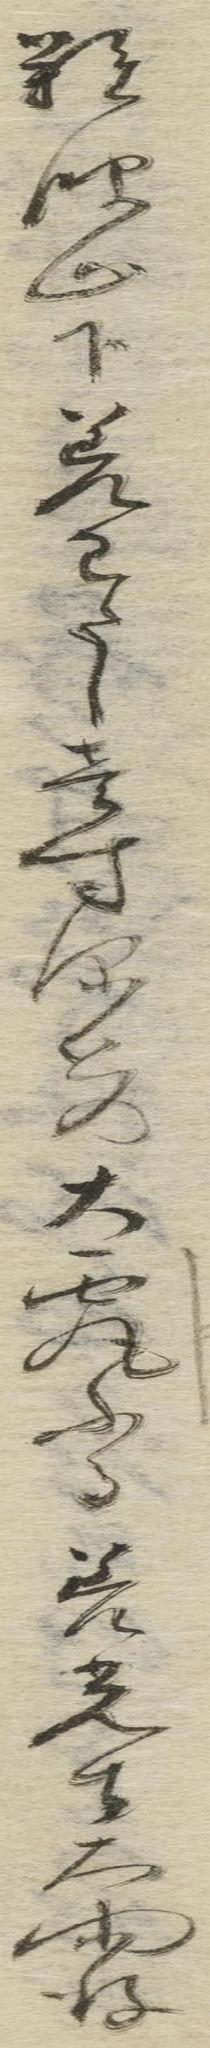難波山下差わたし壱寸ほとの大霰ふる善光寺大雨後
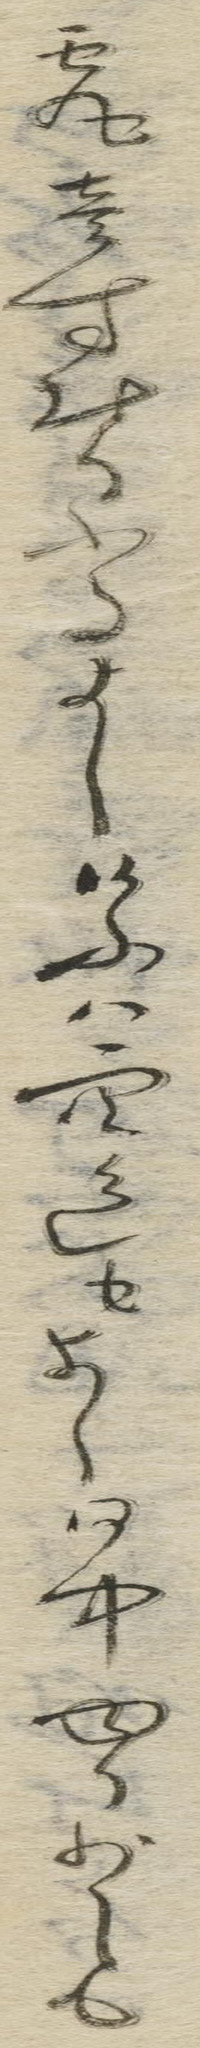霰壱寸計りふるよしけふハ空色もよし日中ゆり少しも
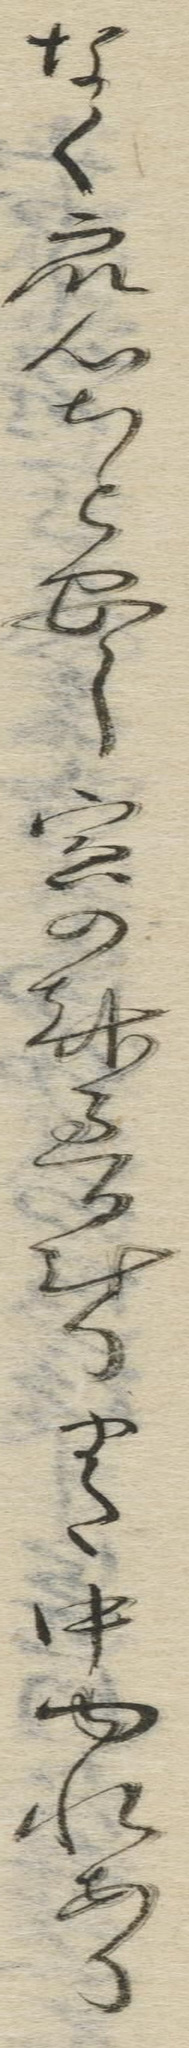なく衆人ちと安し寅の刻過る計りまた中ゆれあり
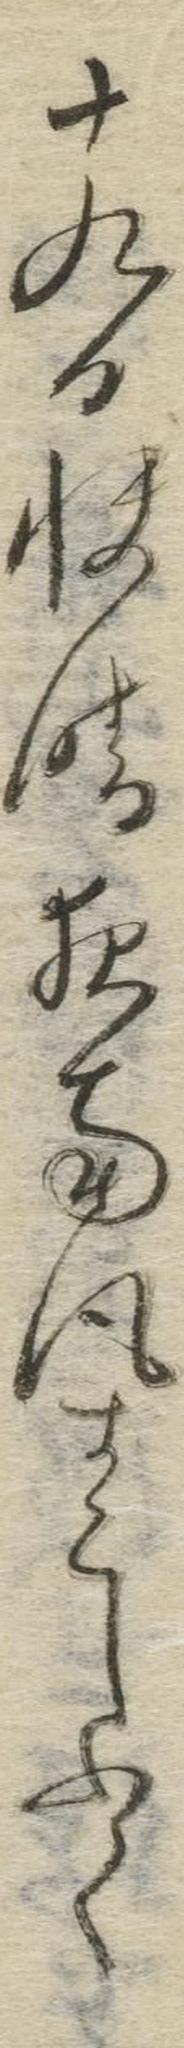十九日快晴夜南風すこしふく
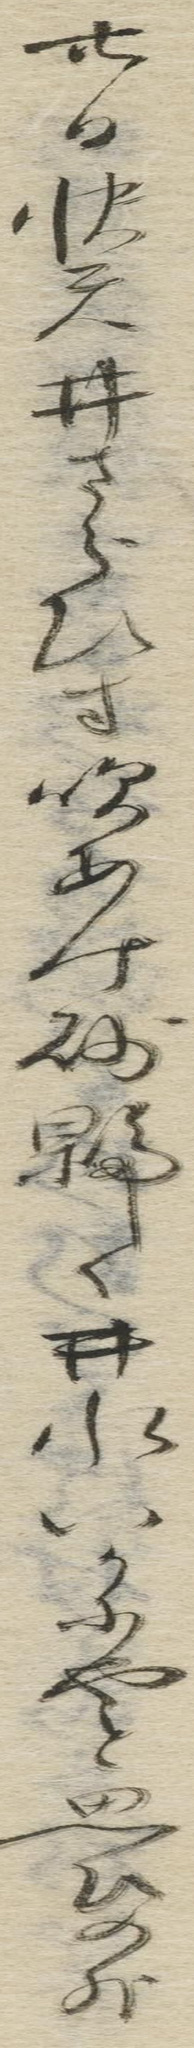廿日快天井さらひす吹あけ砂夥しく井水いかにやと思ひの外
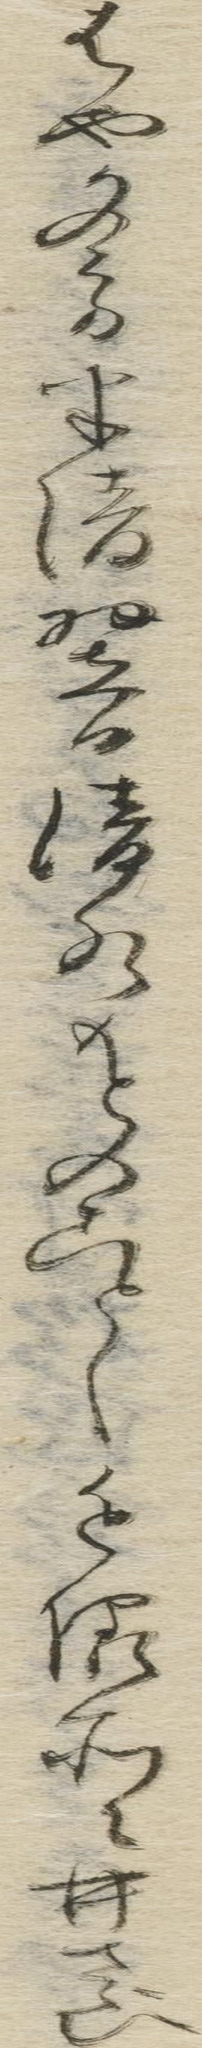はや夕方半清翌日清水もとのことし近隣所々井さらひ
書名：弘化丁未天變日記
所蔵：東京大学地震研究所図書室 Earthquake Research Institute Library, The University of Tokyo, JAPAN
